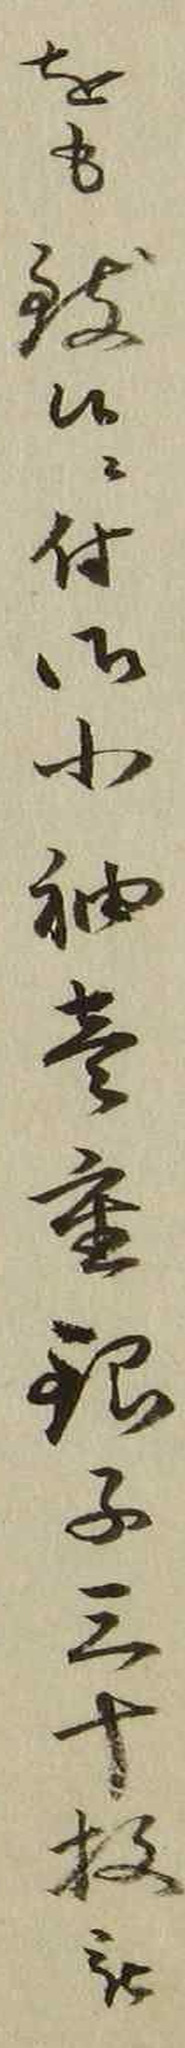をも致候に付御小袖壱重銀子三十枚被
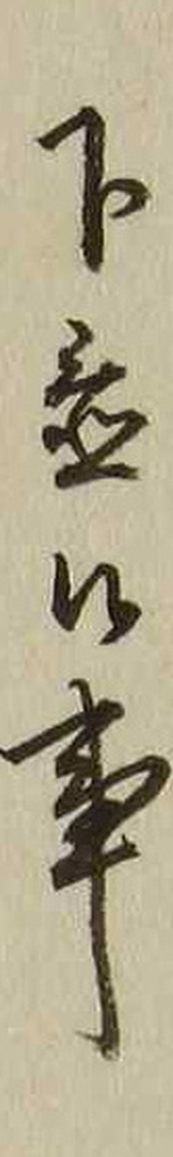下置候事
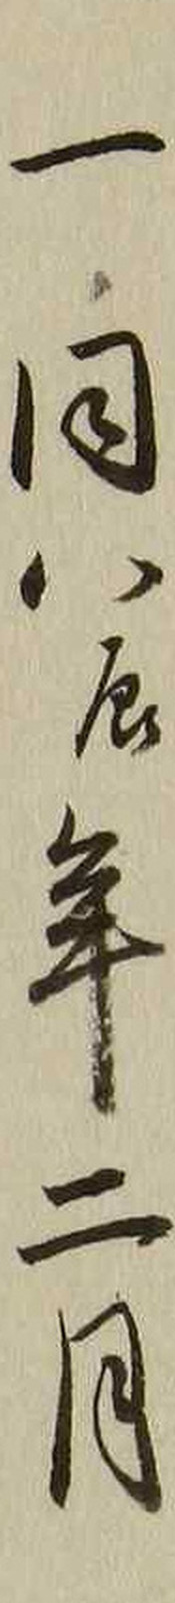一同八辰年二月
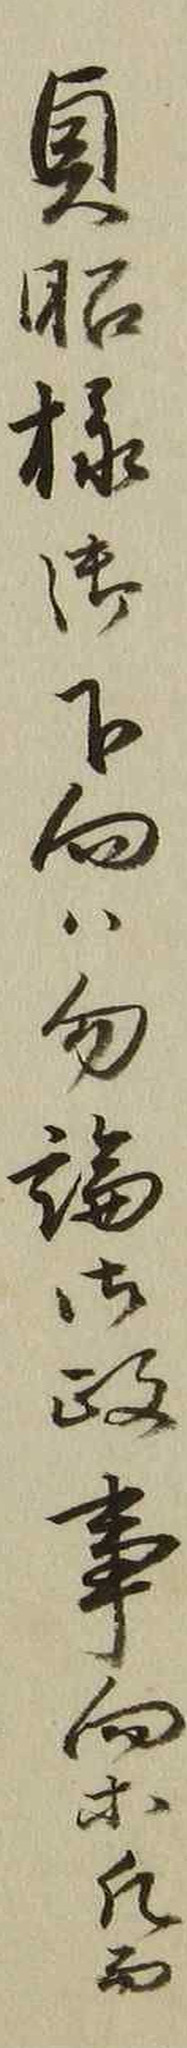貞昭様御下向は勿論御政事向等凡而
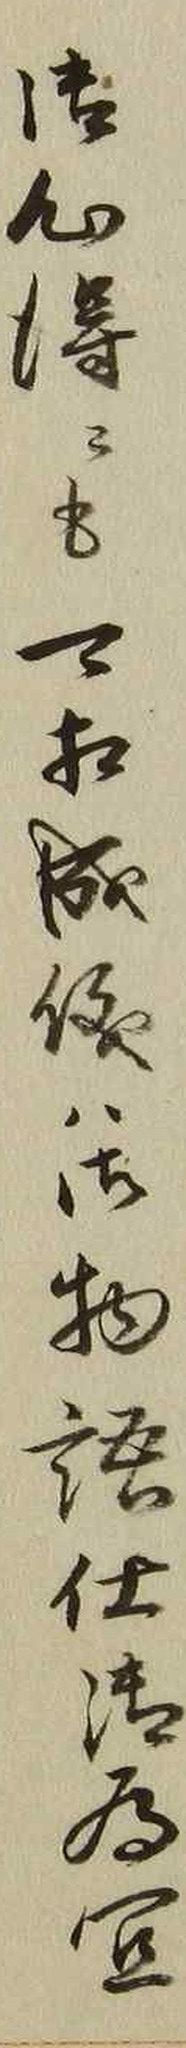御心得にも可相成儀は御物語仕御為宜
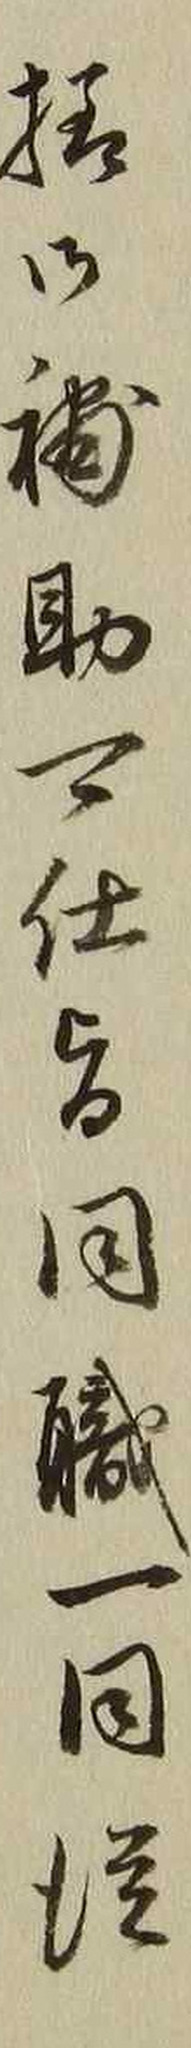様御補助可仕旨同職一同従
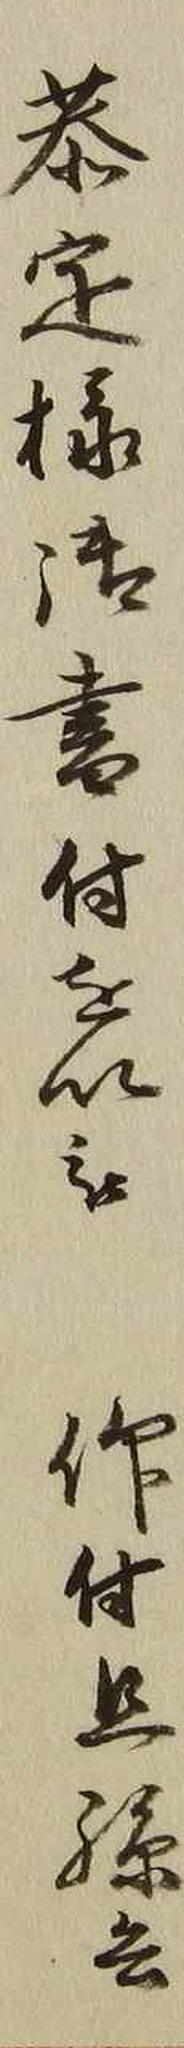恭定様御書付を以被仰付且孫兵
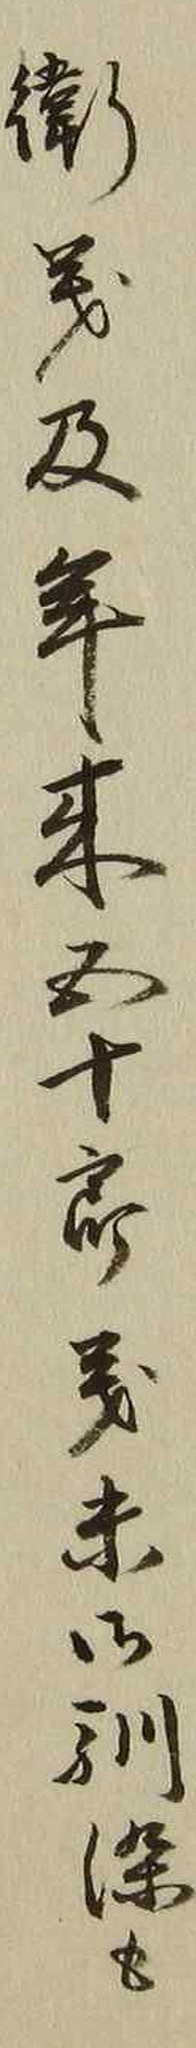衛義及年來五十郎義未御馴染も
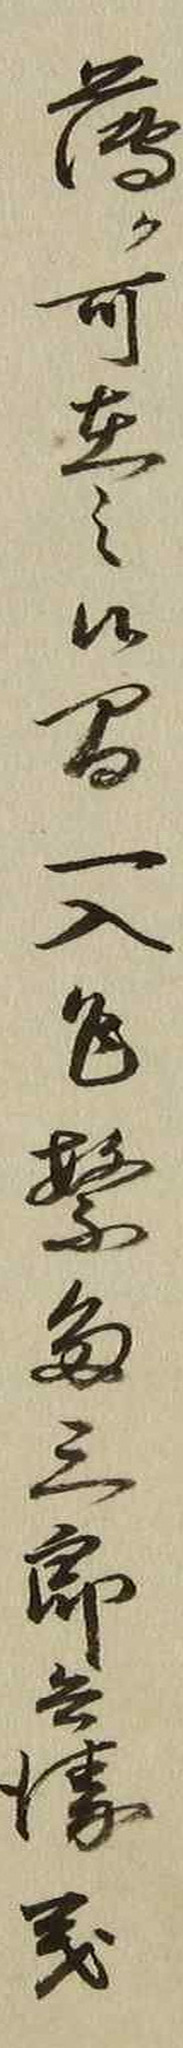薄く可在之候間一入乍繁多三郎兵衛義
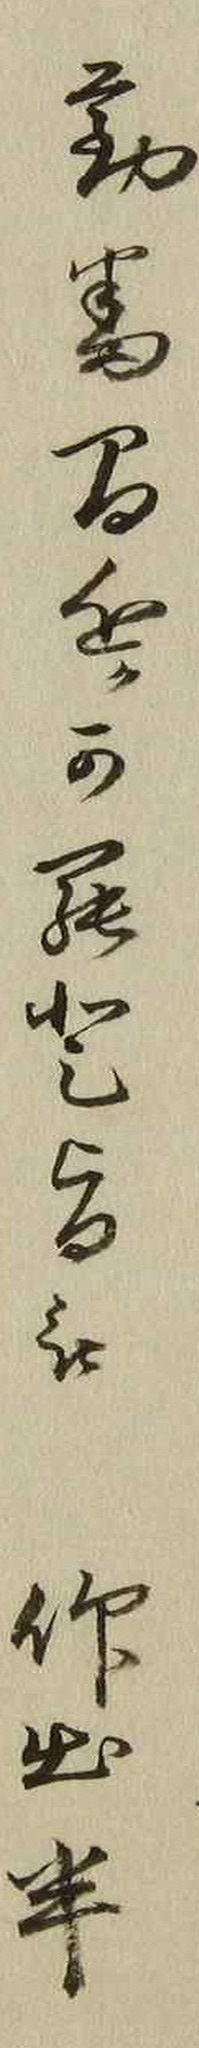勤番間近く可罷登旨被仰出半
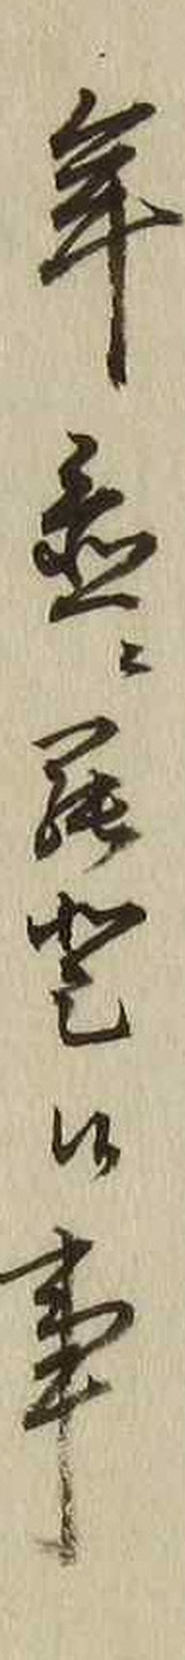年置に罷登候事
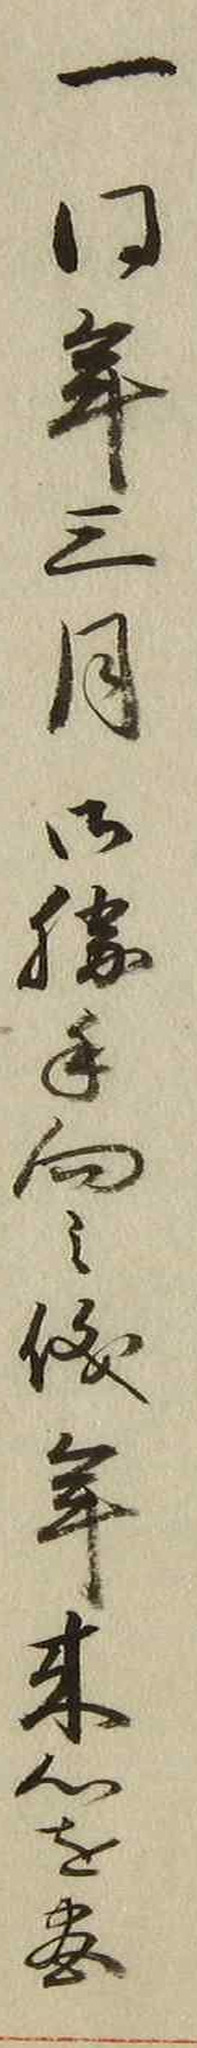一同年三月御勝手向之義年來心を尽
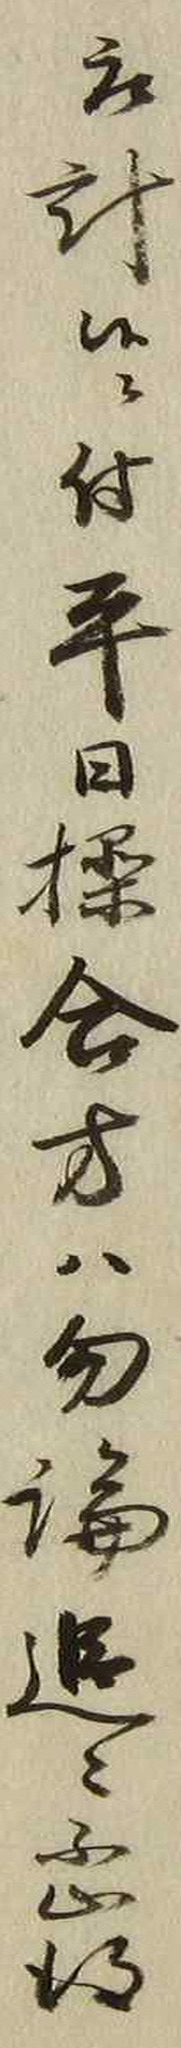取計候に付平日操合方は勿論追々不止得
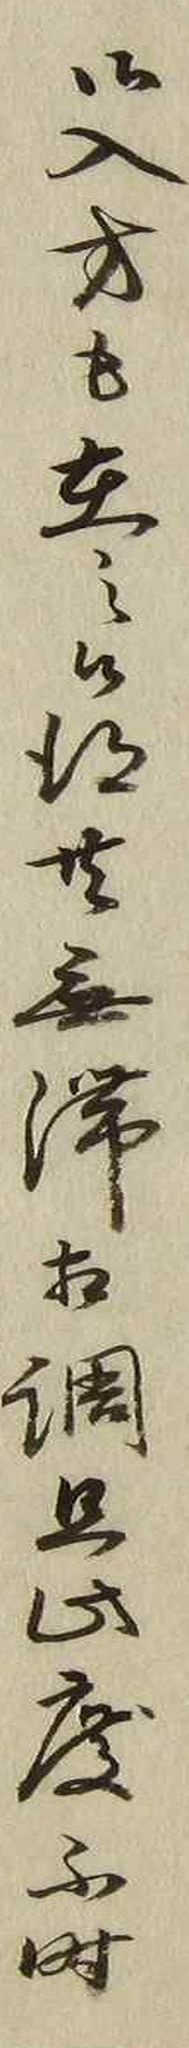御入方も在之候得共無滞相調且此度不時
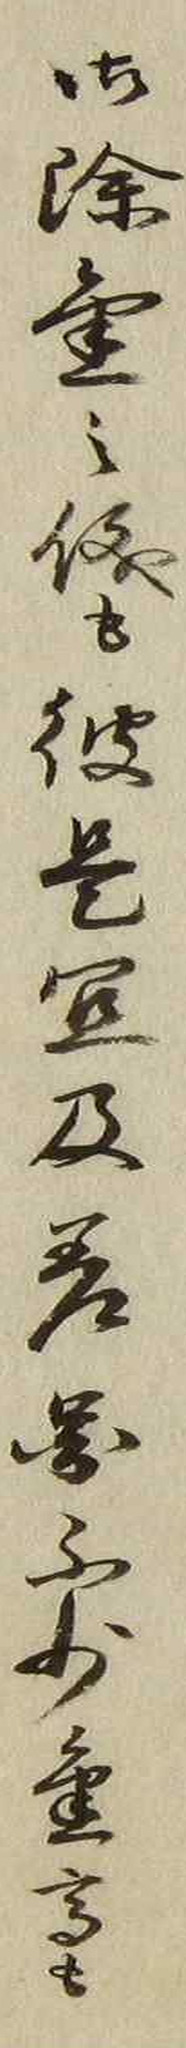御除金之儀も彼是宜及指図不少金高も
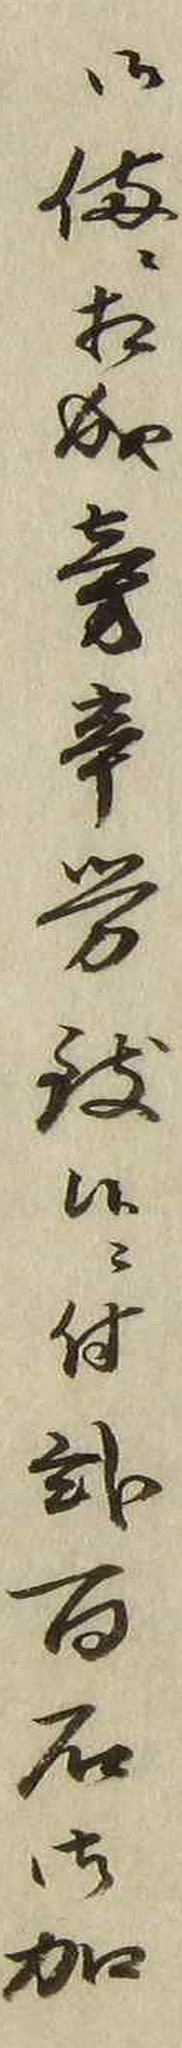御備に相成旁辛労致候に付弐百石御加
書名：諸士系譜　巻之125　た之部1
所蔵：会津若松市立会津図書館
